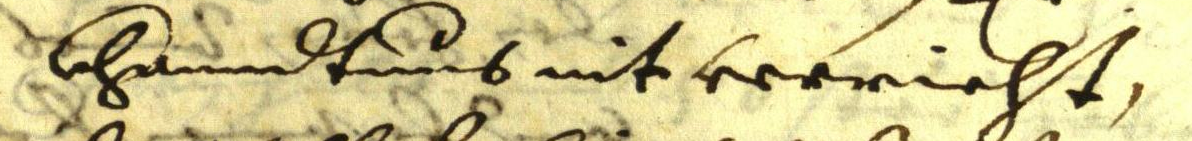khonndtūng nit verricht,
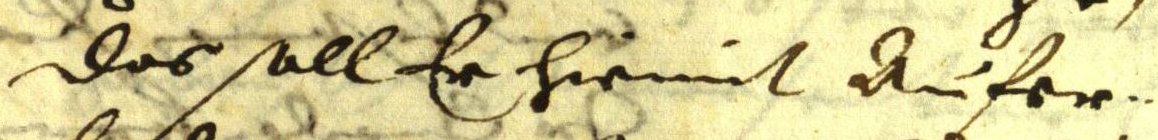das soll Er hiemit Aūfer-
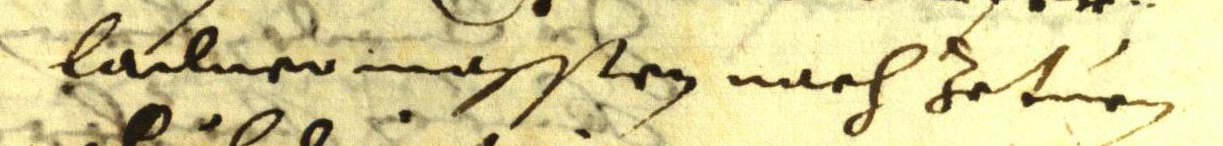laden massen nach Zetūen
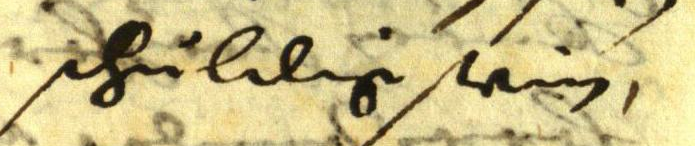schūldig sein,
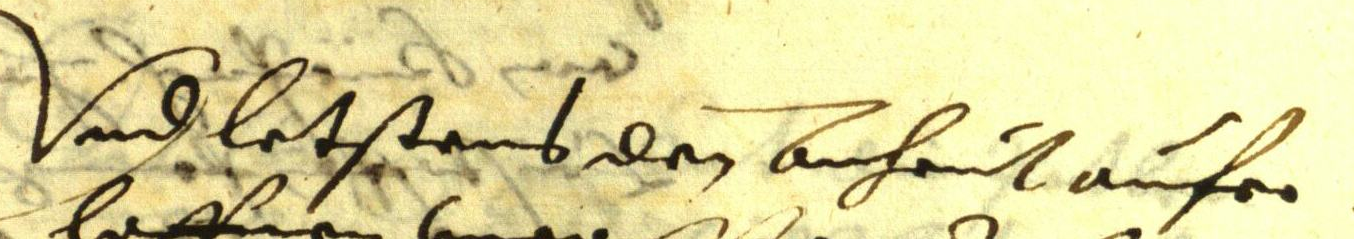Vnd letstens den Anheūt aūfer-
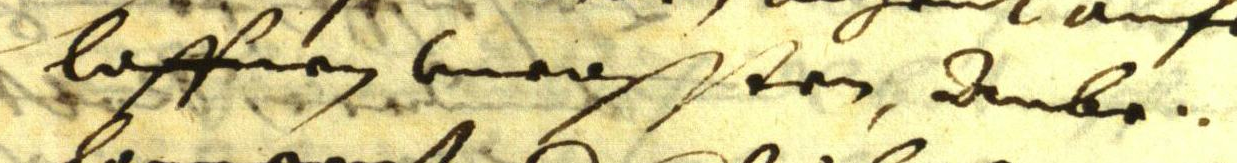loffnen vncossten Anbe¬
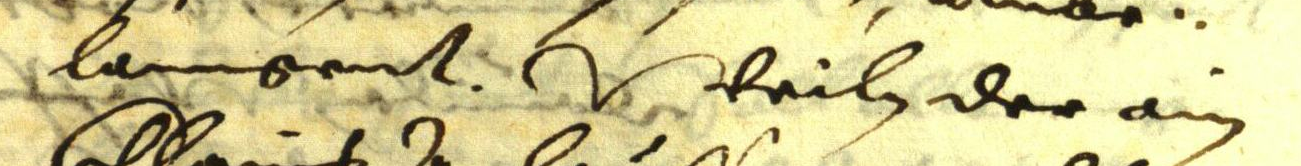lanngent. Weiln der ain
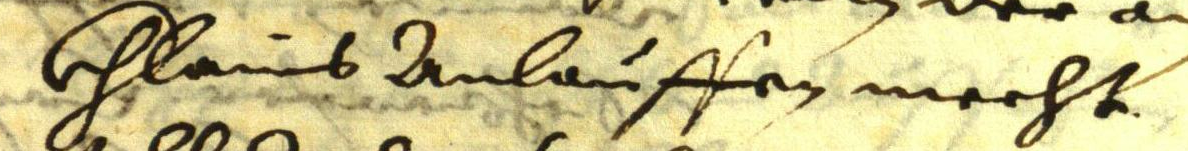khlains Anlaūffen mecht.
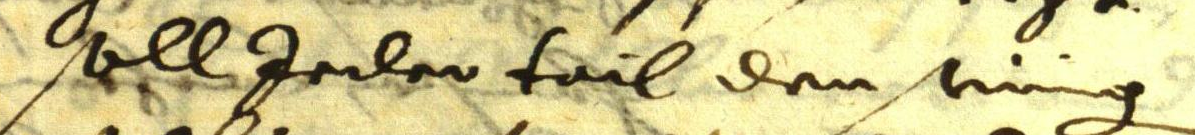soll Jeder tail den seinig
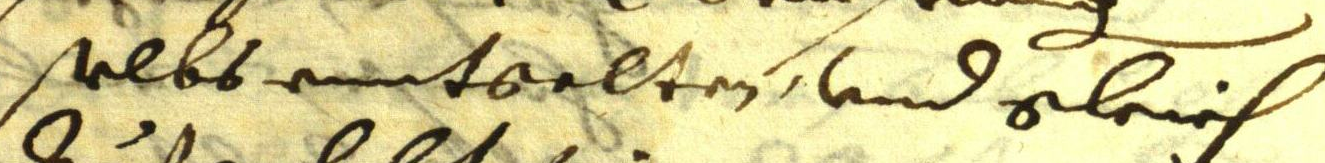selbs enntgelten, vnd gleich
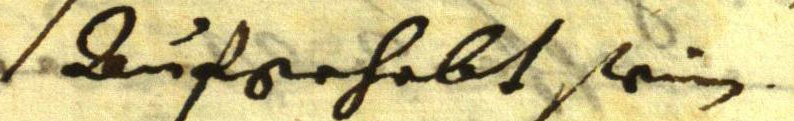Aūfgehebt sein.
